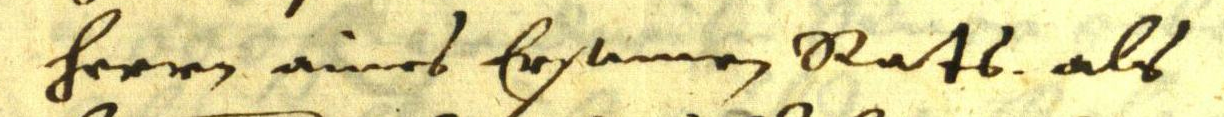herrn aines Ersamen Rats. als
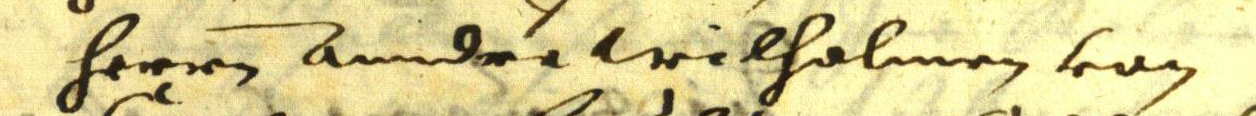herrn Anndre Wilhalmen von
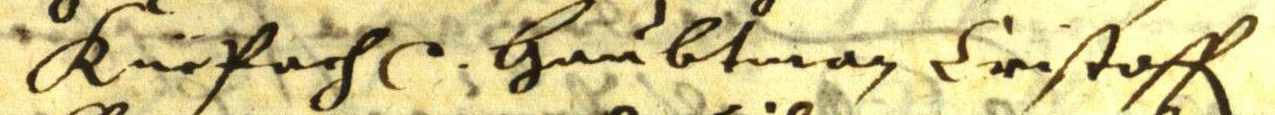Kiepach etc. Haūbtman Cristoff
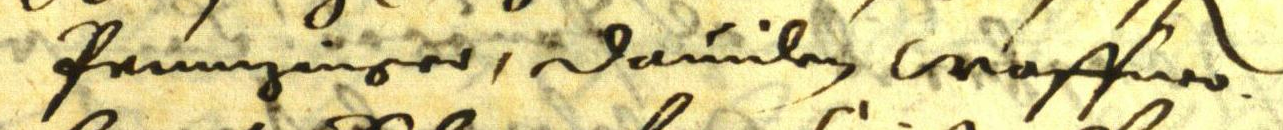Pennzinger, Daūiden Waffner.
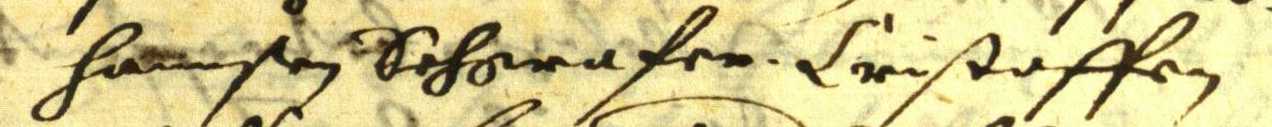hannsen Schgrafer. Cristoffen
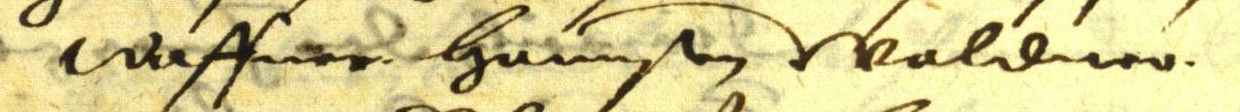Waffner. Hannsen Waldner.
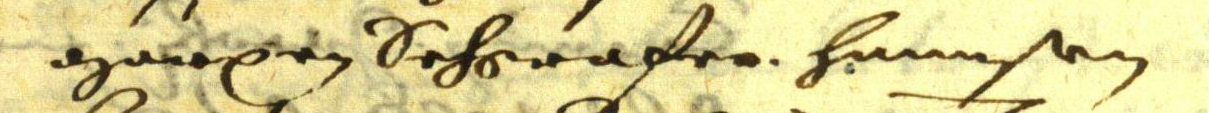Marxen Schgrafer. hannsen
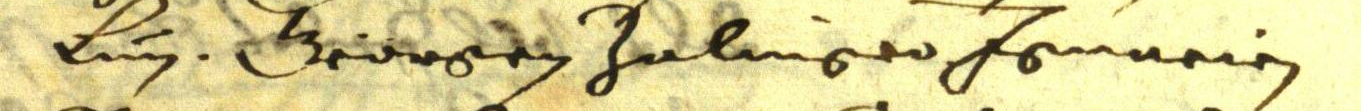Lūn. Georgen Zalinger. Ignacien
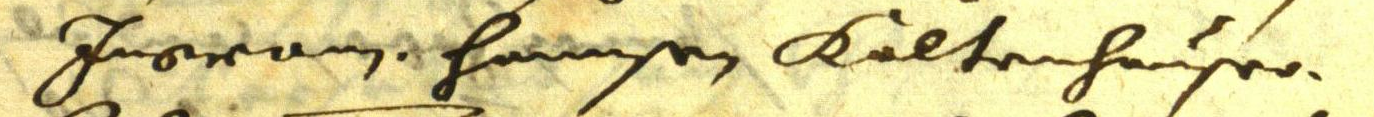Ingram. hannsen Kaltenhaūser.
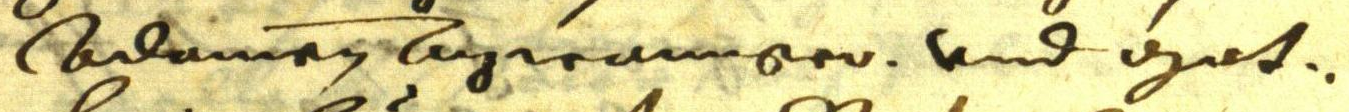Adamen Azwannger. vnd Mat¬
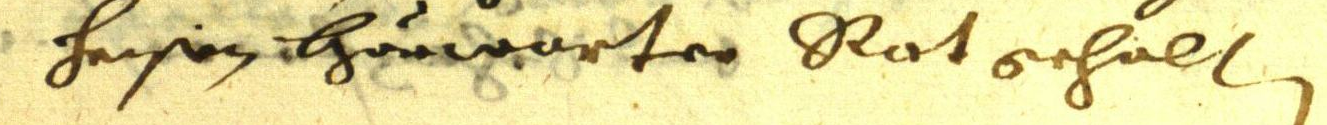heisen Hōrwarter Rat gehalt
